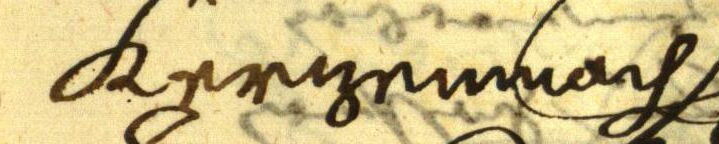Kerzenmach
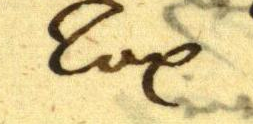Tax
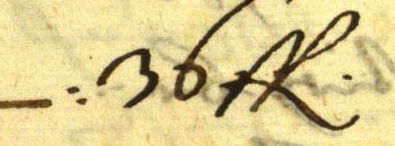—: 36 fl.
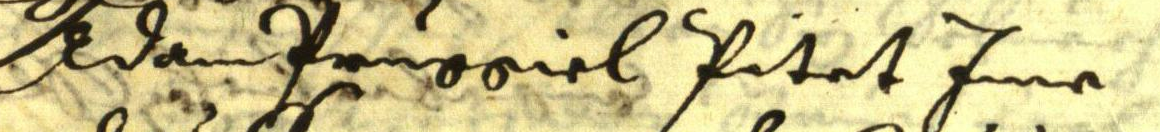Adam Prūggiel Pitet Ime
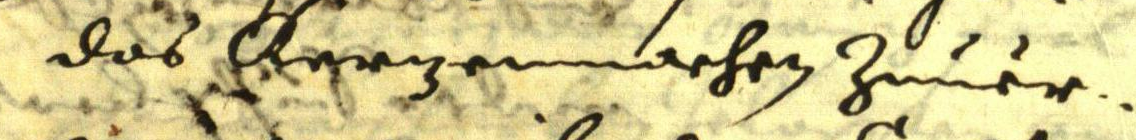das Kerzenmachen Zūūer¬
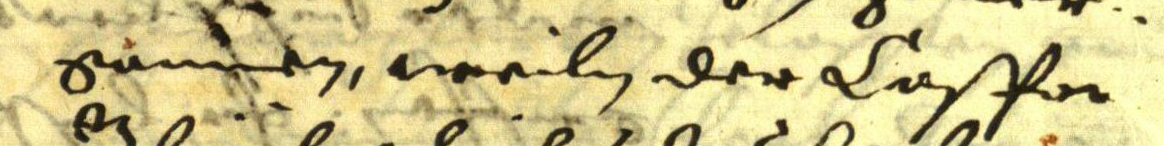gonnen, weiln der Caspar
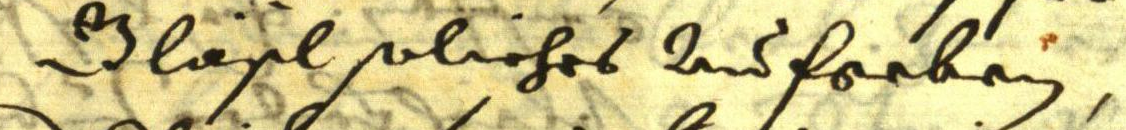Bläsl soliches Aūfgeben,
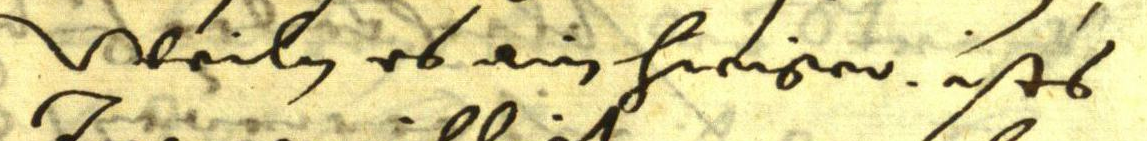Weiln es ain hieigen. ists
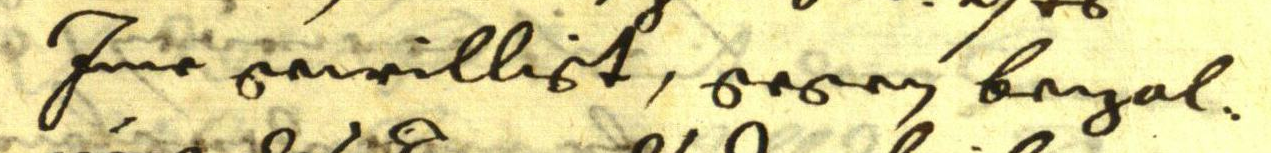Ime gewilligt, gegen bezal¬
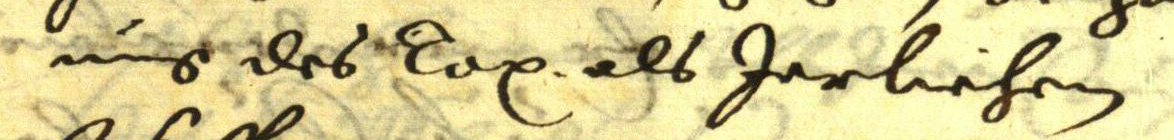ūng des Tax. als Jarlichen
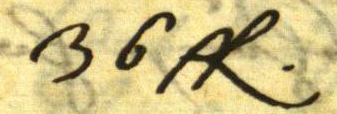36 fl.
